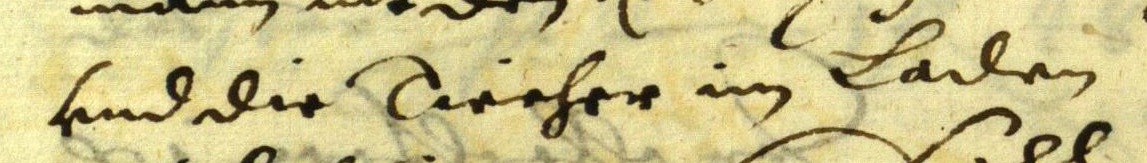vnd die Tiecher im Laden
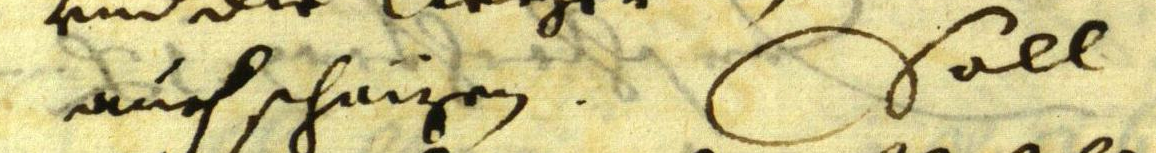aūch schäzen. Soll
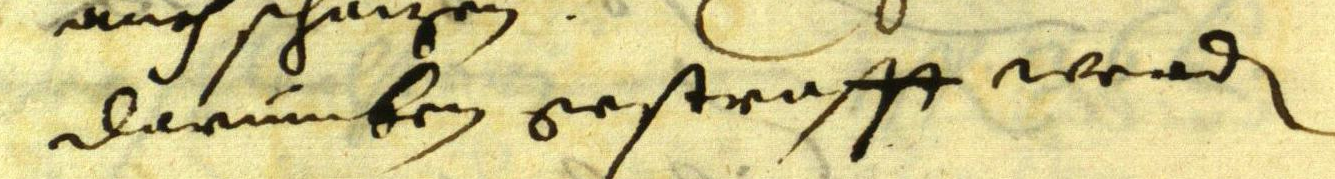darūmben gestrafft werd.
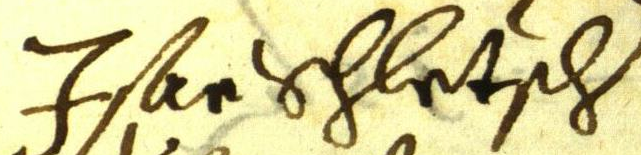Isac Schletsch
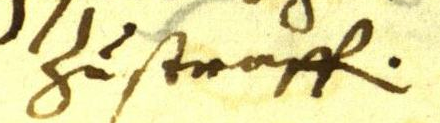Zū straff.
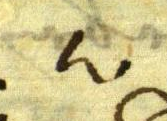t
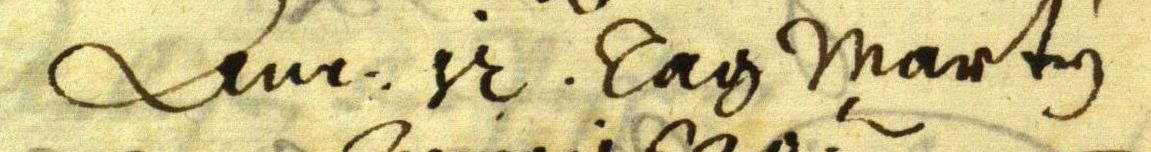Am: 12. Tag Martȳ
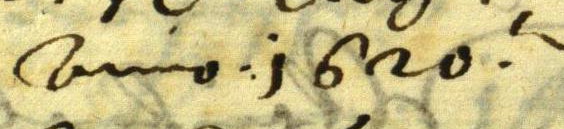Anno: 1620 t.
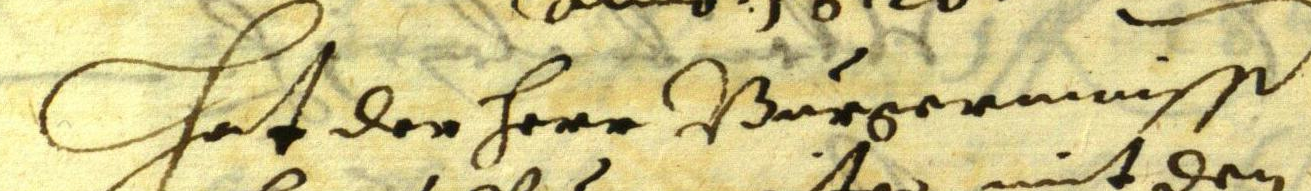Hat der herr Būrgermaisst
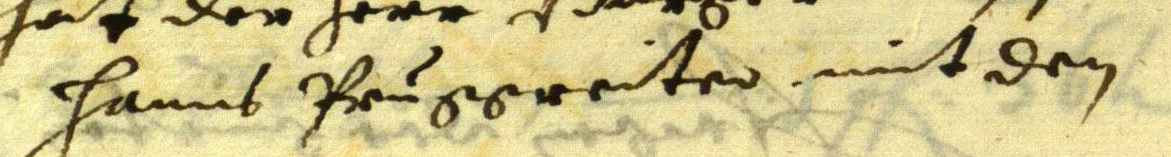Hanns Prūggreiter. mit den
